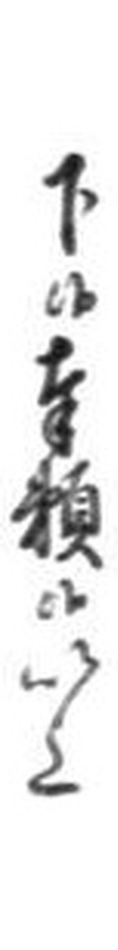下候奉頼候以上
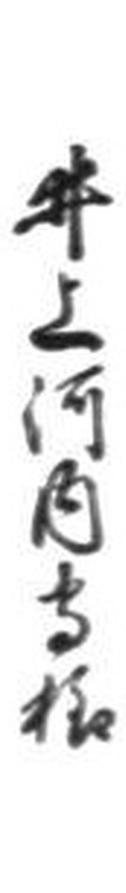井上河内守様

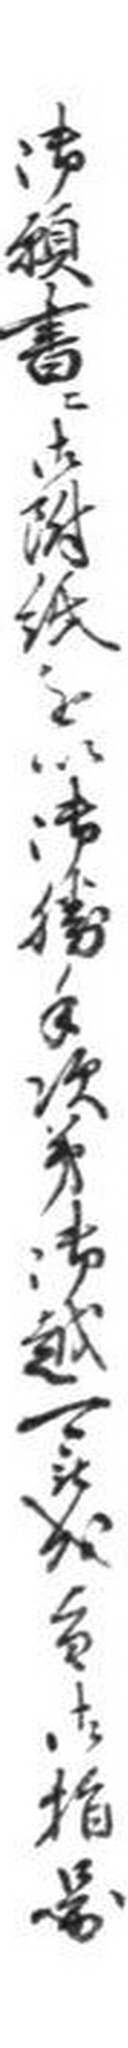御願書ニ御付紙を以御勝手次第御越可被成旨御指図
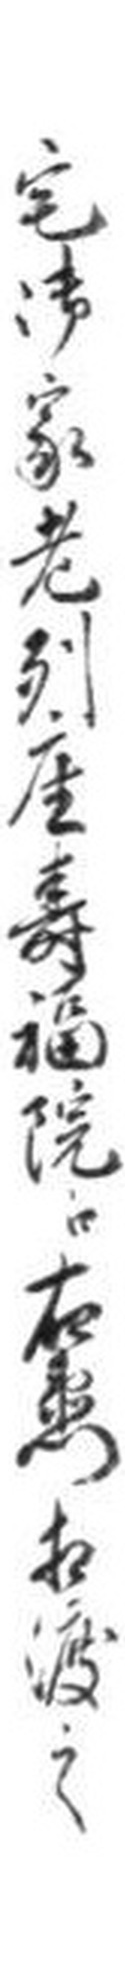宅御家老列座寿福院江右衛門相渡之
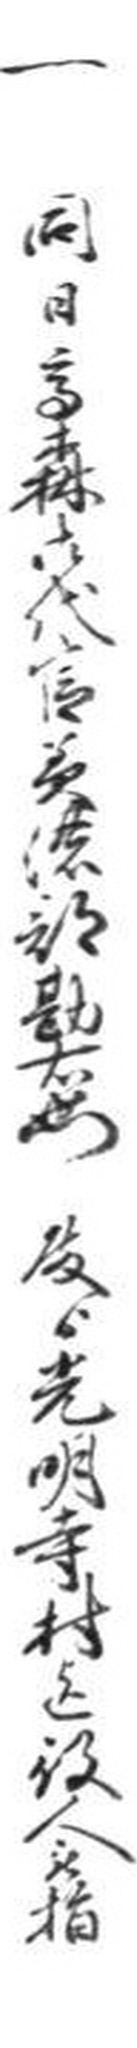一同日高森御代官美濃部勘右衛門殿ゟ光明寺村迄役人被指
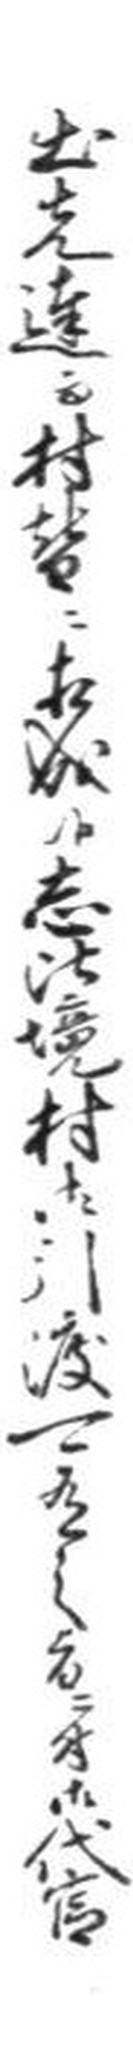出先達而村替ニ相成候志比境村御引渡可有之旨ニ付御代官
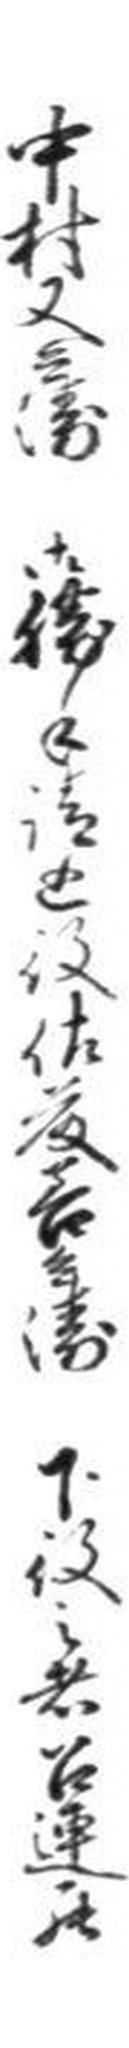中村又兵衛御勝手請込役佐藤善兵衛下役之者召連罷
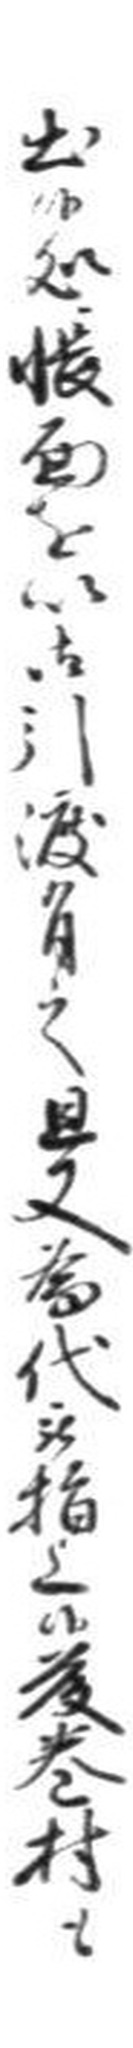出候処帳面を以御引渡有之且又為代被指上候藤巻村も
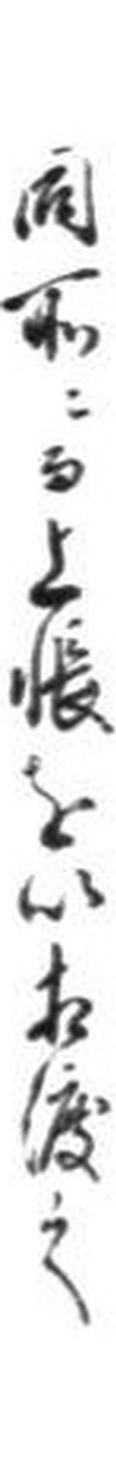同所ニ而上帳を以相渡之
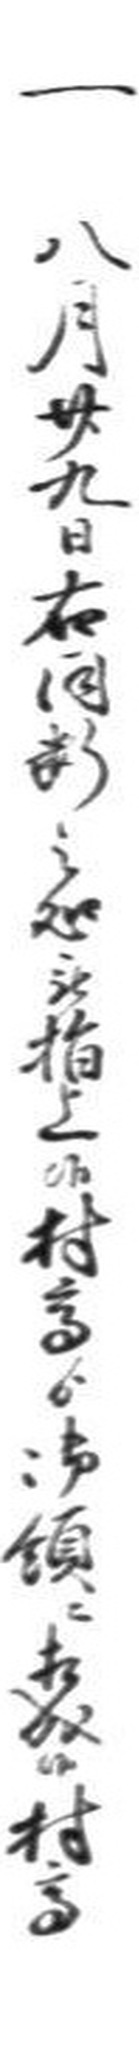一八月廿九日右同断之処被指上候村高ゟ御領ニ相成候村高
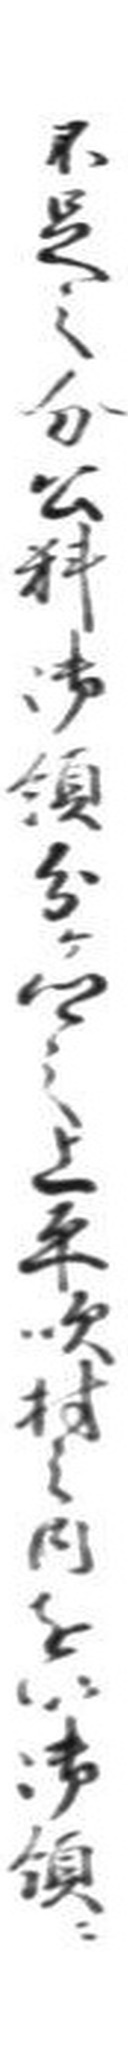不足之分公料御領分ケ郷之上平吹村之内を以御領ニ
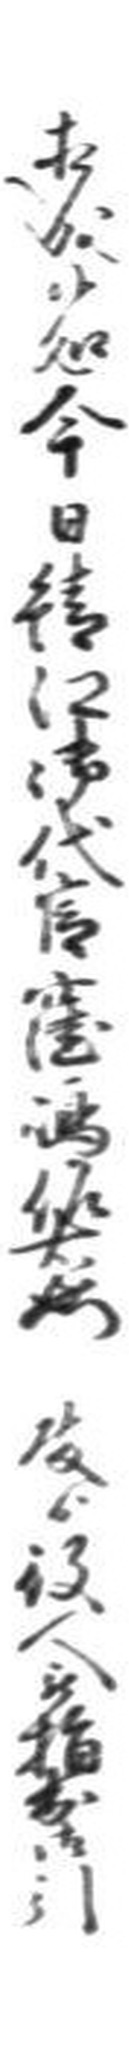相成候処今日鯖江御代官窪嶋作右衛門殿ゟ役人被指出御引
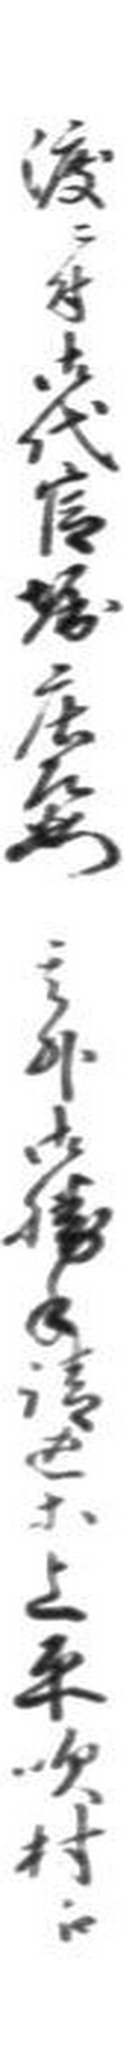渡ニ付御代官堀庄左衛門其外御勝手請込等上平吹村江
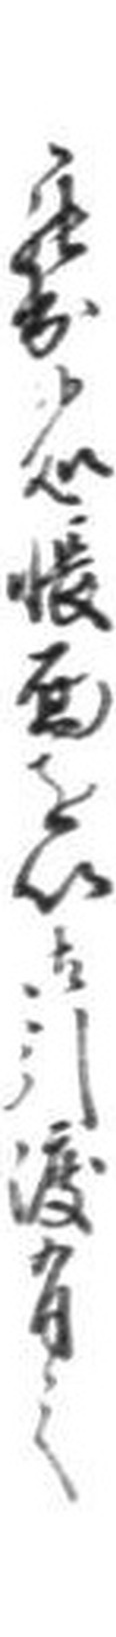罷出候処帳面を以御引渡有之
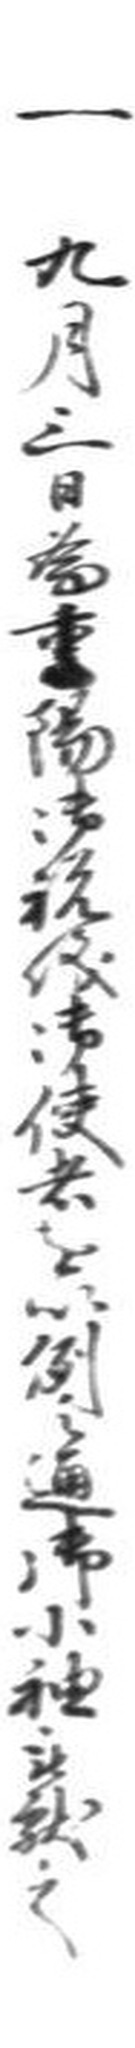一九月三日為重陽御祝儀御使者を以例之通御小袖被献之
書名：家譜 三十三 吉邦公 享保四年
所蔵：福井県文書館 Fukui Prefectural Archives
